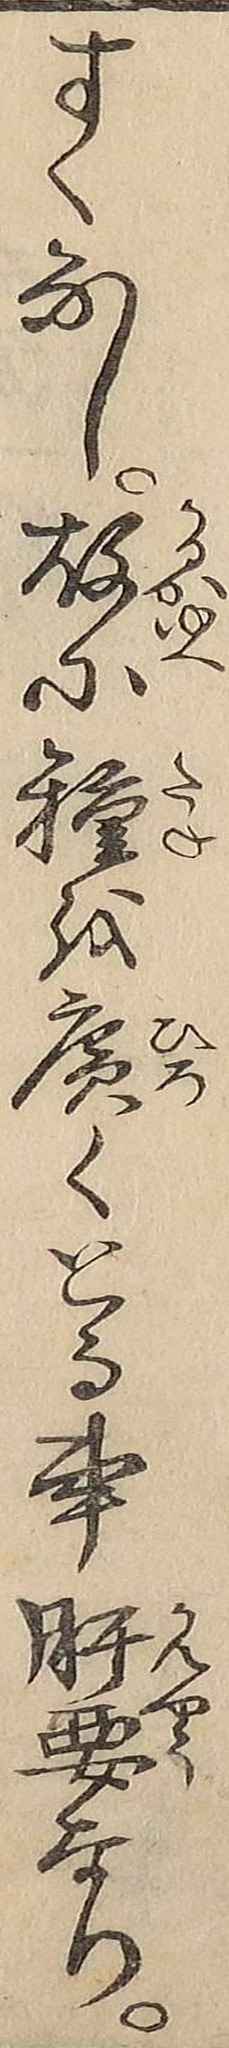すくなし。故に種を広くとる事肝要なり。
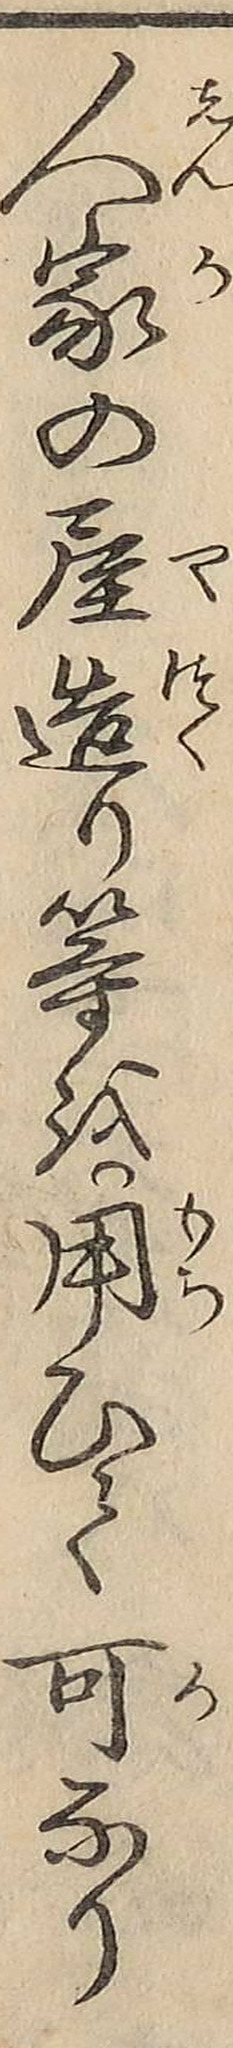人家の屋造り等を。用ひて可なり
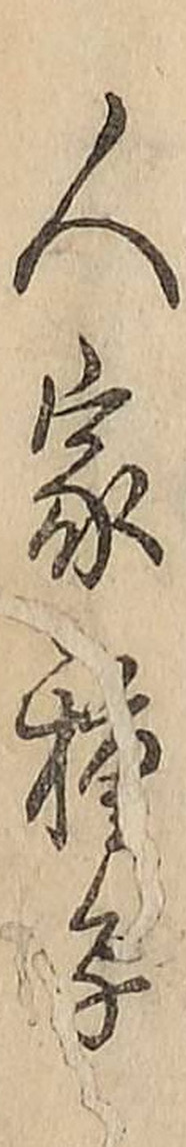人家種子

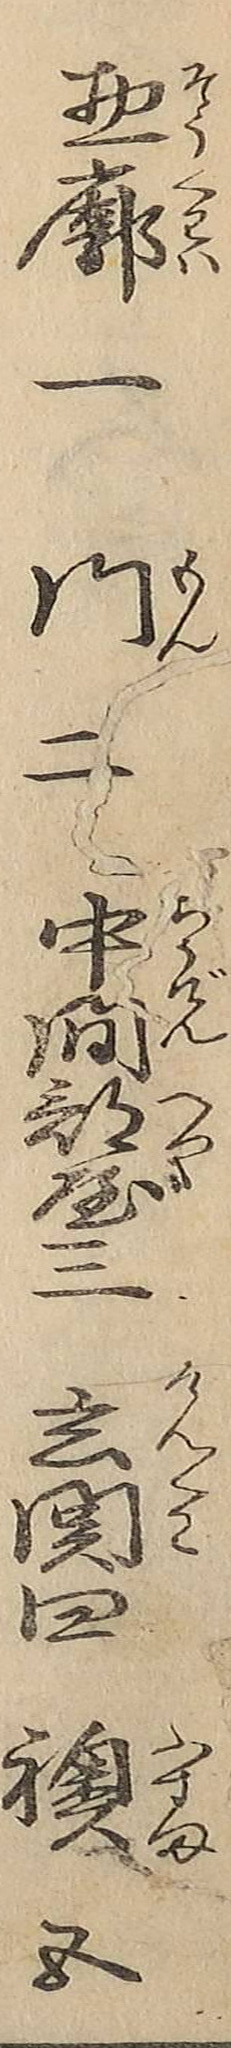惣廓一門二中間部屋三玄関四襖五
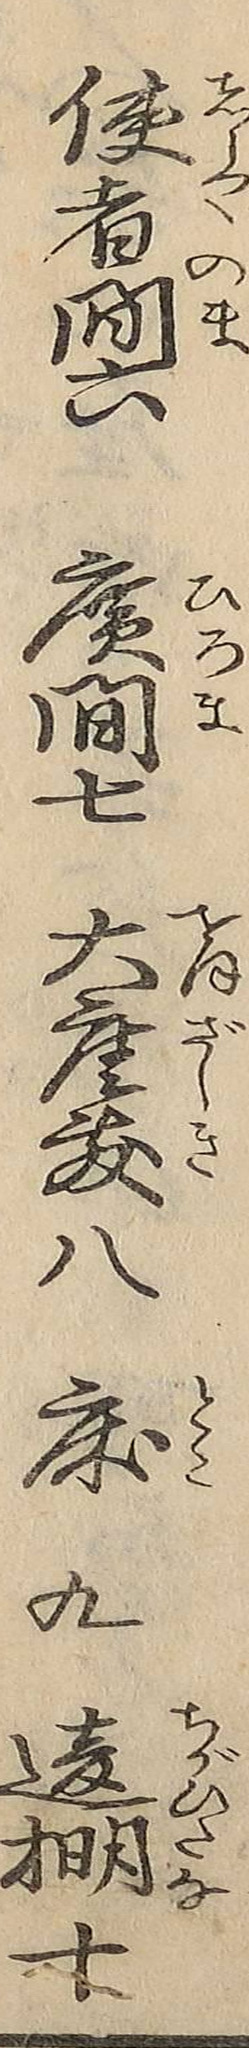使者間六広間七大座敷八床九違棚十
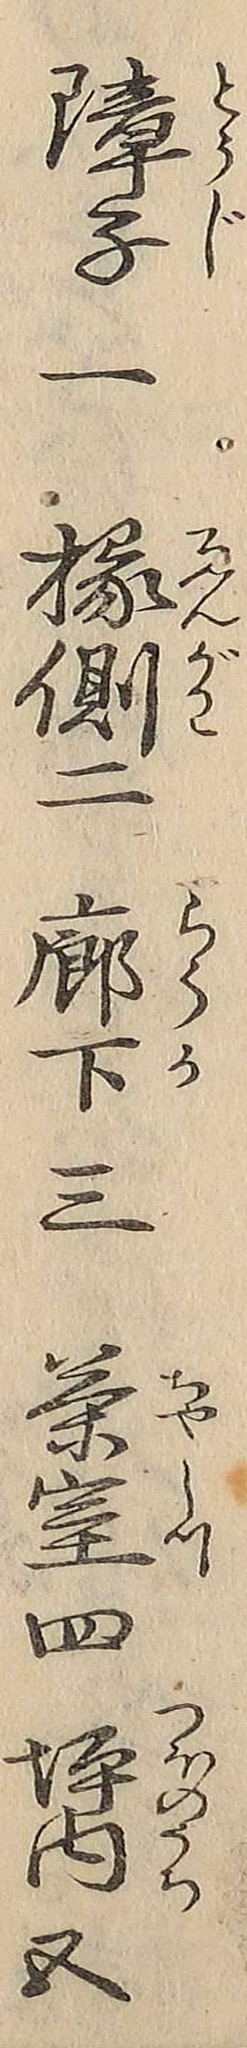障子一椽側二廊下三茶室四坪内五
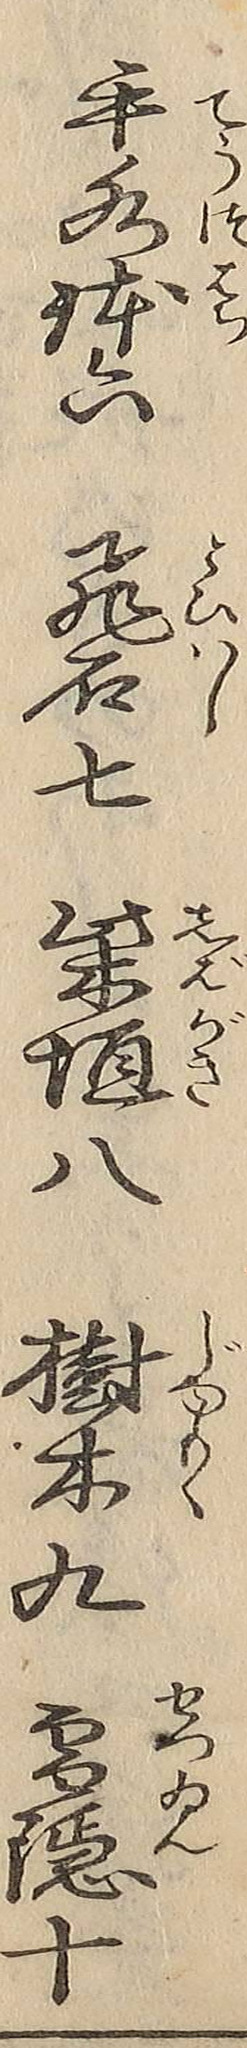手水鉢六飛石七柴垣八樹木九雪隠十
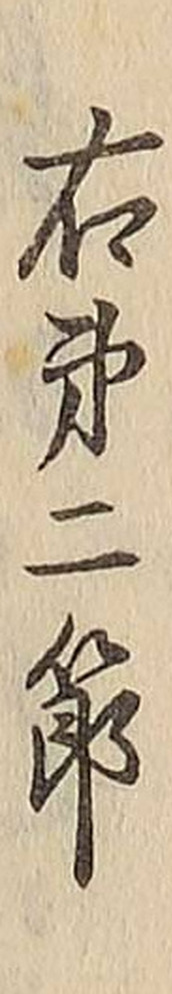右第二節
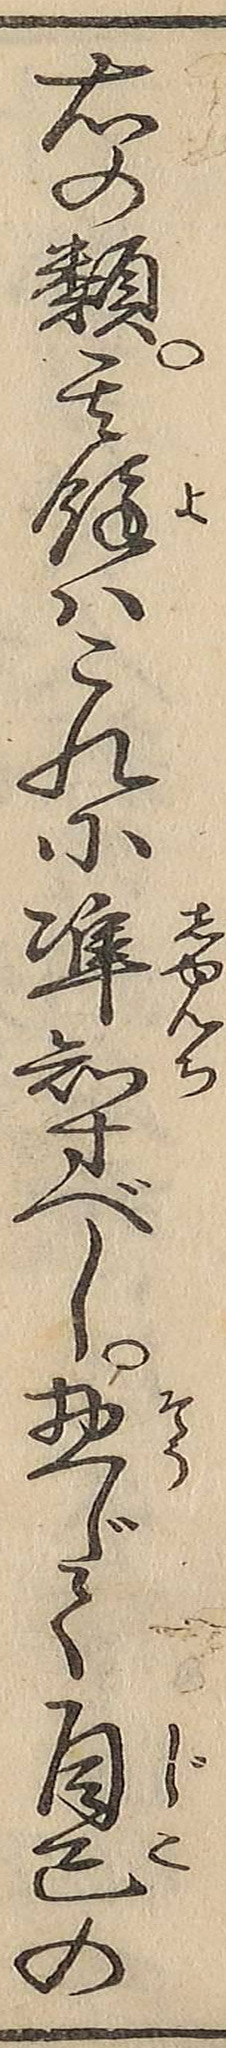右の類。其餘はこれに準知すべし。惣じて自己の
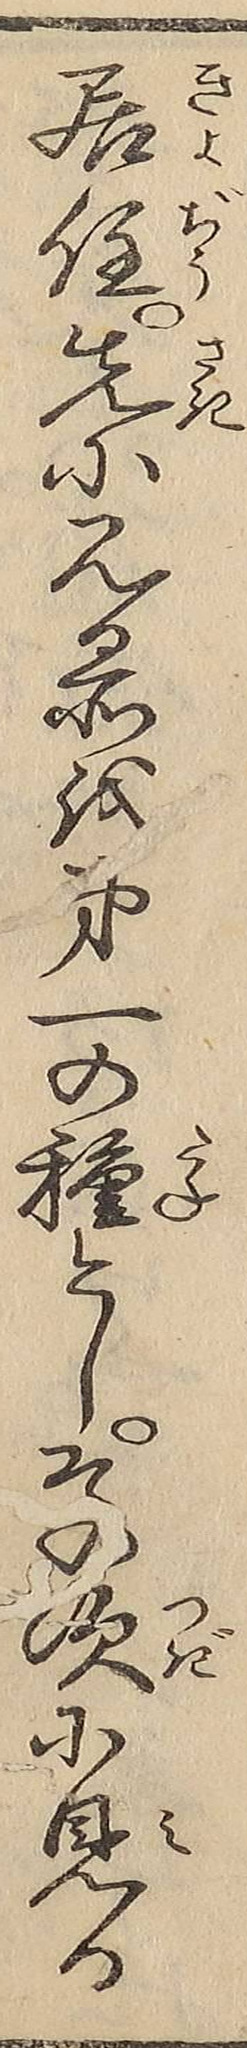居住。先に見る所を第一の種とし。その次に見る
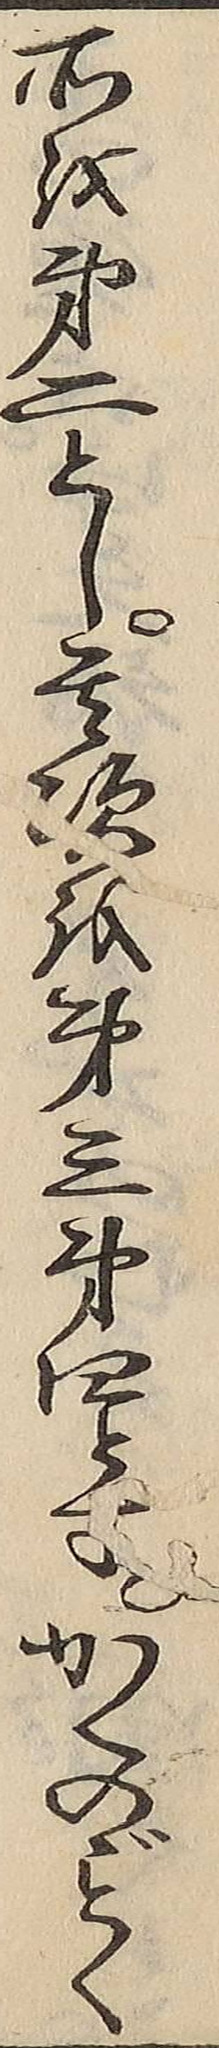所を第二とし。其次を第三第四とす。かくのごとく
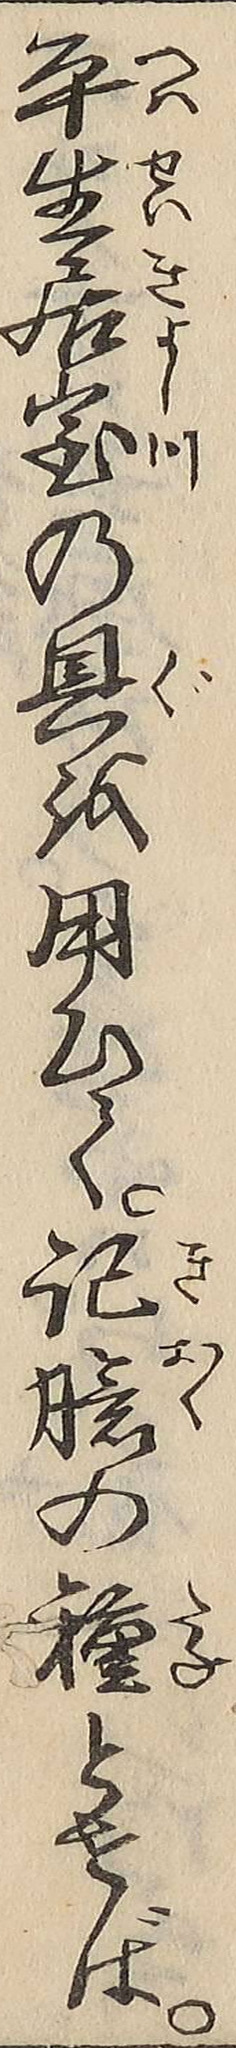平生居室の具を用ひて。記臆の種とせば。
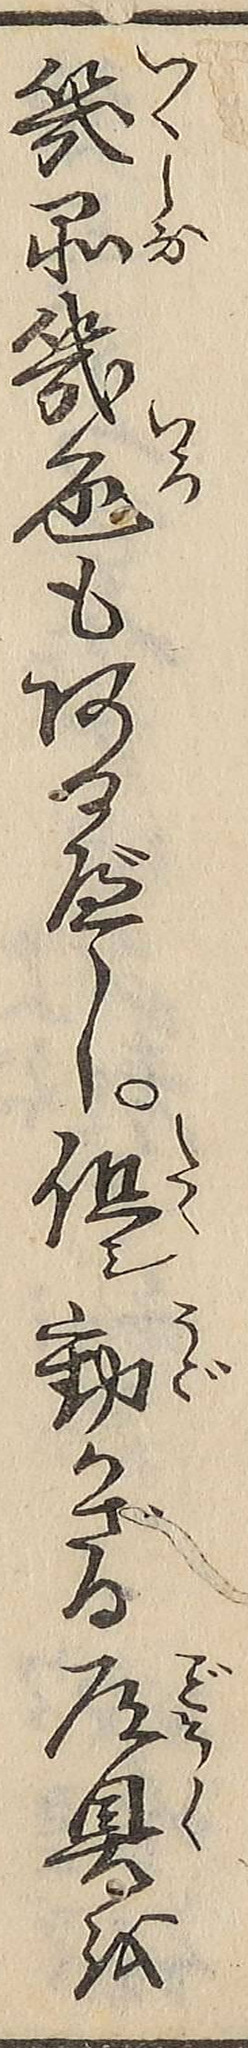幾品幾色もあるべし。但し動かざる道具を
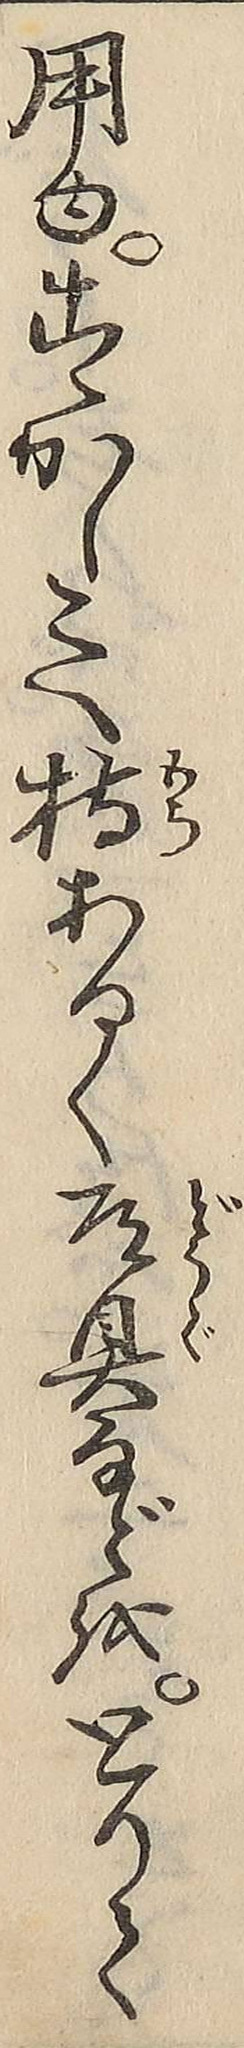用ゆ。こゝかしこへ持あるく道具などを。とりて
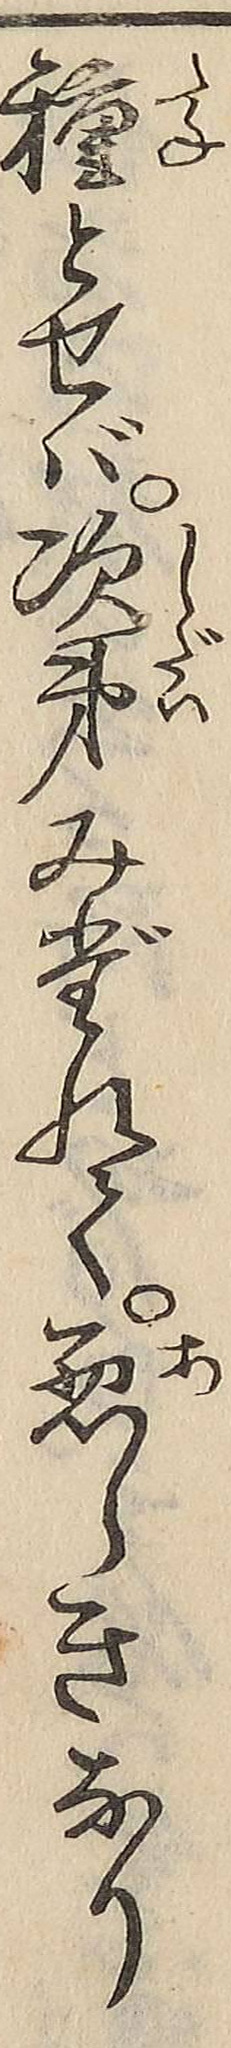種とせば。次第みだれて。悪しきなり
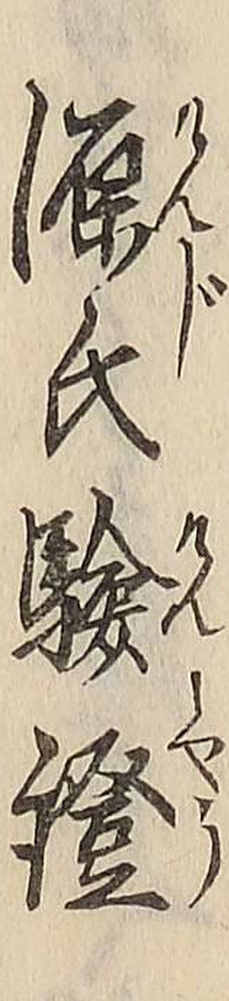源氏験證
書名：物覺秘傳
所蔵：神戸大学附属図書館 国文学研究資料館
